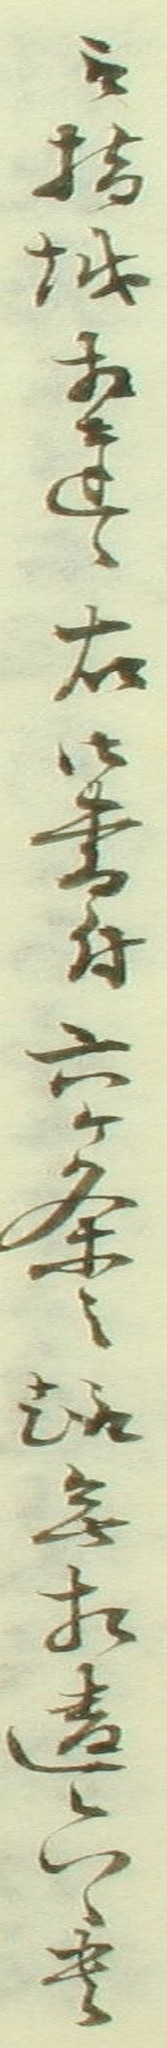被指越相達候右御書付六ヶ条之趣無相違候はゝ貴
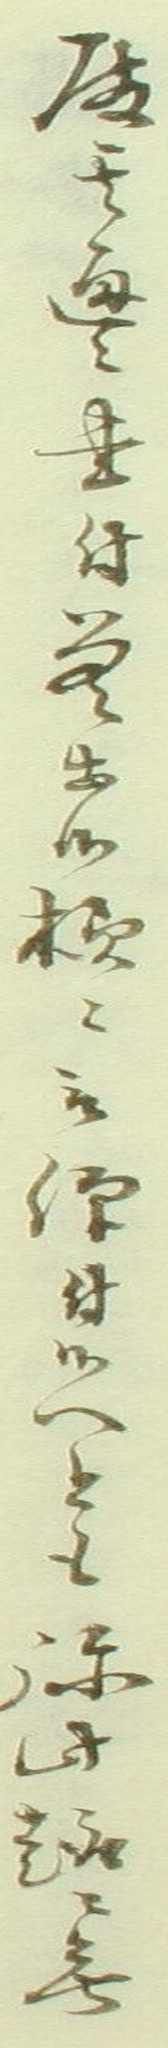殿其通に書付差出候様に被仰付候へとも弥此趣に無
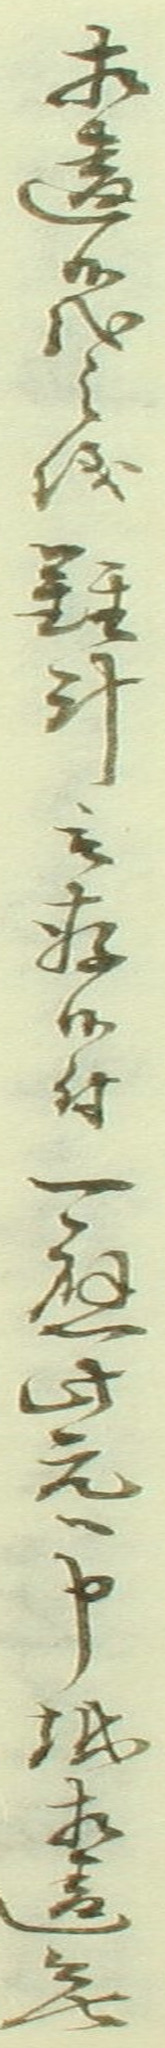相違候哉之儀難計被存候付一応此元へ申越相違無
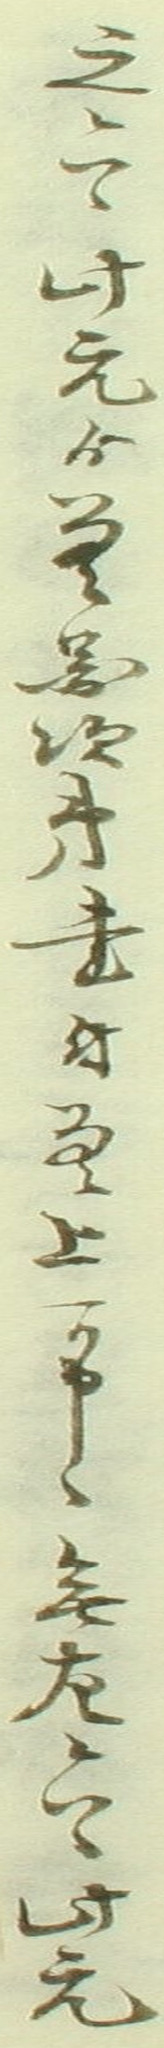之候はゝ此元ゟ差図次第書付差上可申候無左候はゝ此元
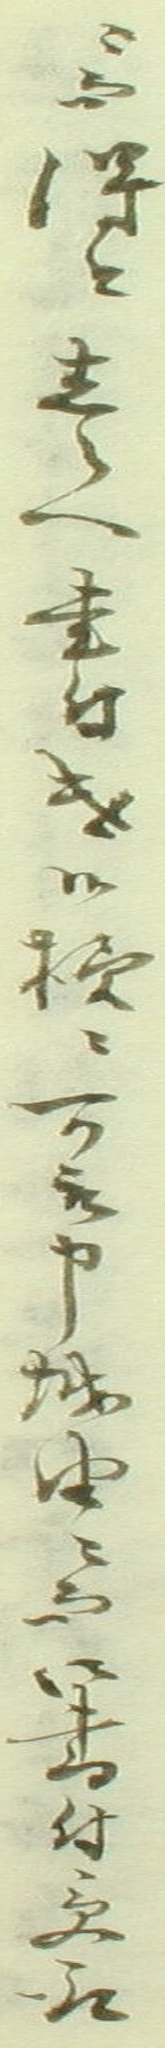に而得としらへ書付遣候様に可被申越由に而御書付受取
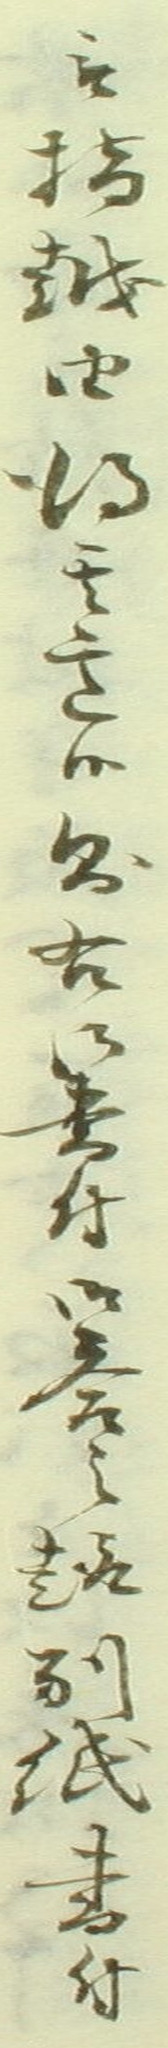被指越由得其意候則右御書付御答之趣別紙書付
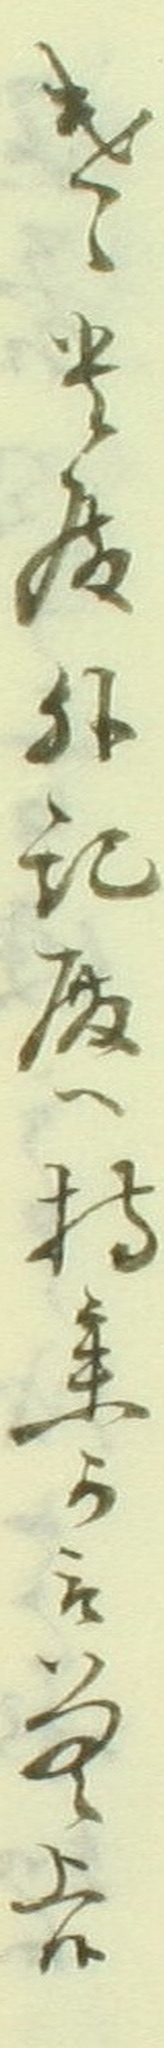遣候貴殿外記殿へ持参可被差上候
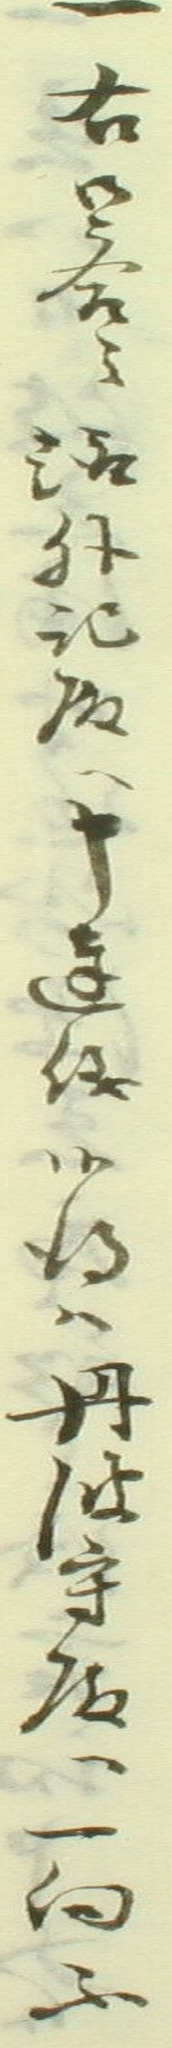一右御答之趣外記殿へ申達儀候得は丹波守殿へ一向不
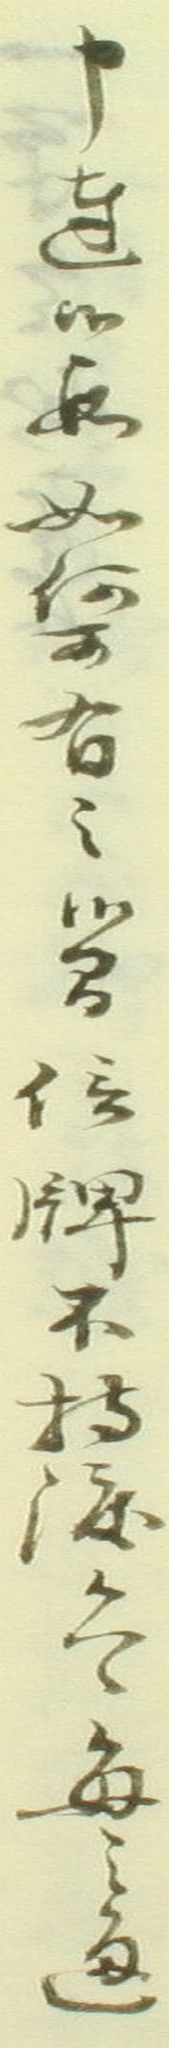申達候段如何可有之候間信牌不持渡候はゝ毎々通
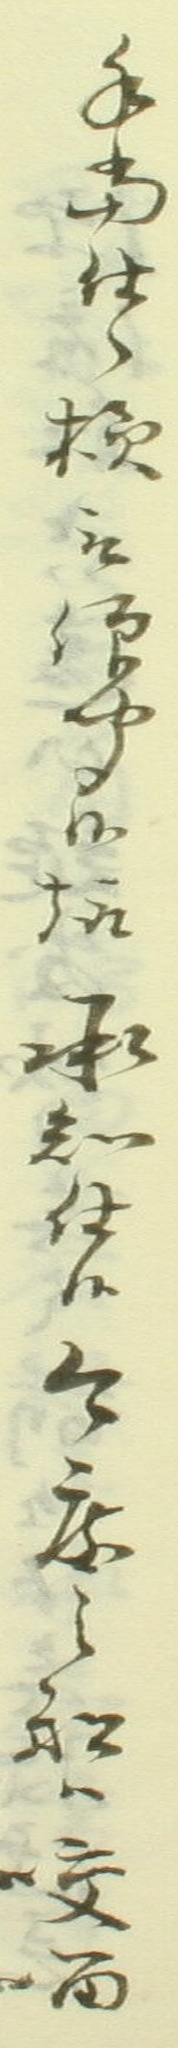手当仕候様被仰聞候趣承知仕候今度之船は咬𠺕
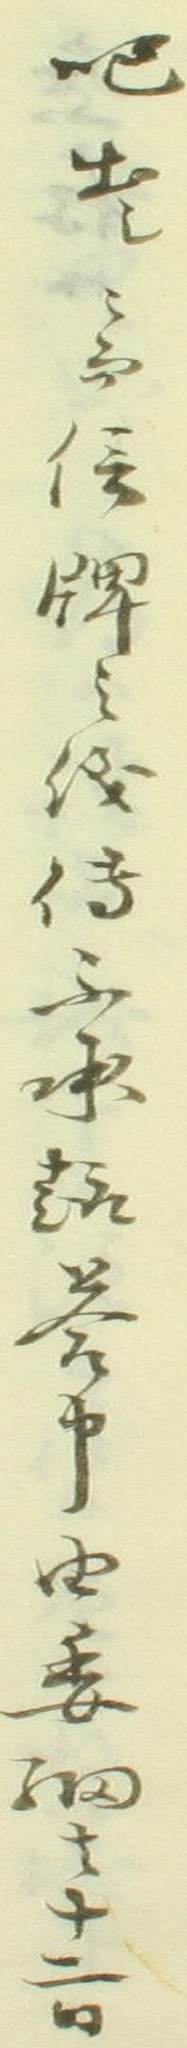吧出しに而信牌之儀伝不承趣答申由委細は十二日
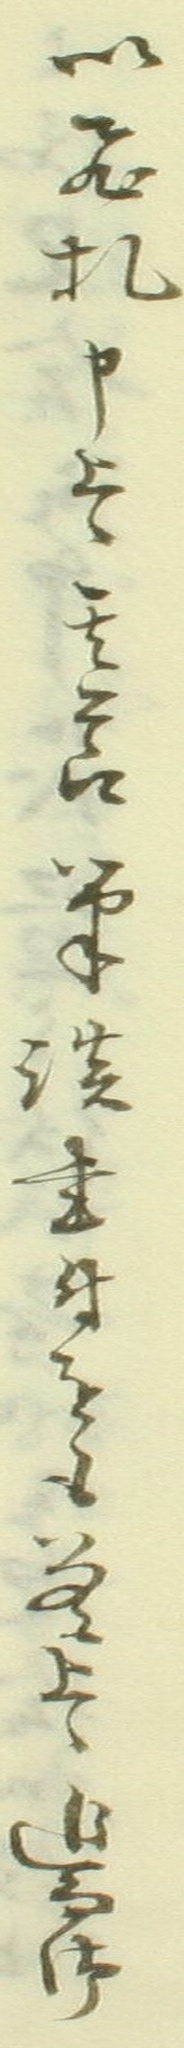以飛札申上候其節筆談書付をも差上候追而御
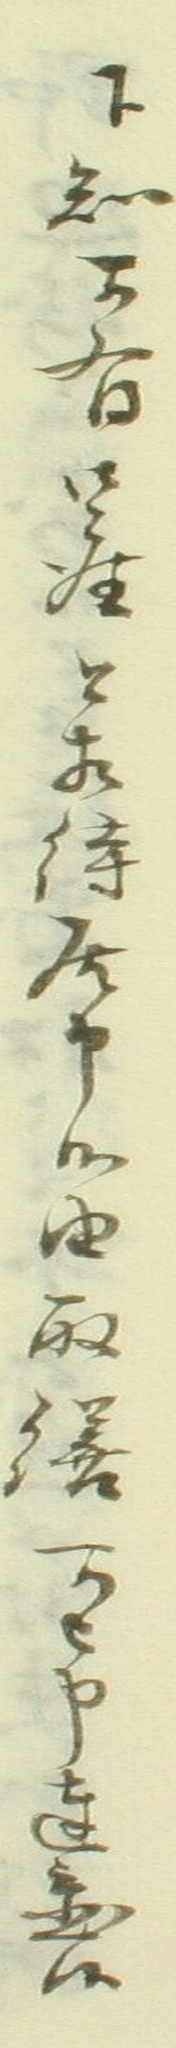下知可有御座と相待居申候由取繕可被申達置候
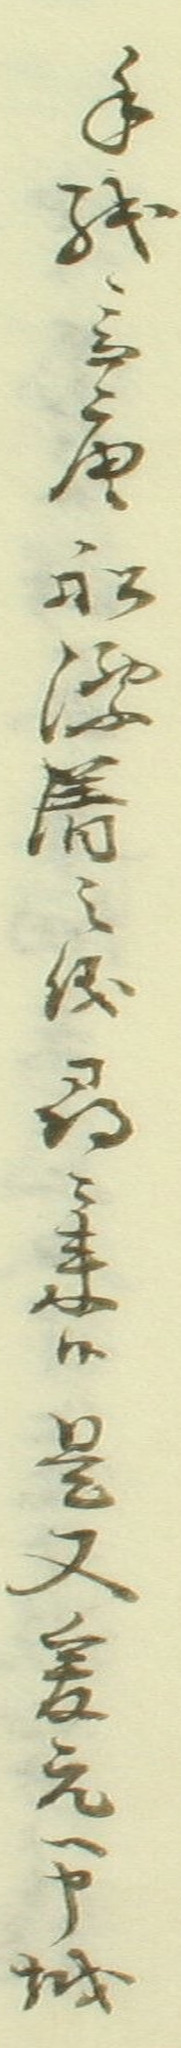手紙に而唐船漂着之儀尋に来候是又爰元へ申越
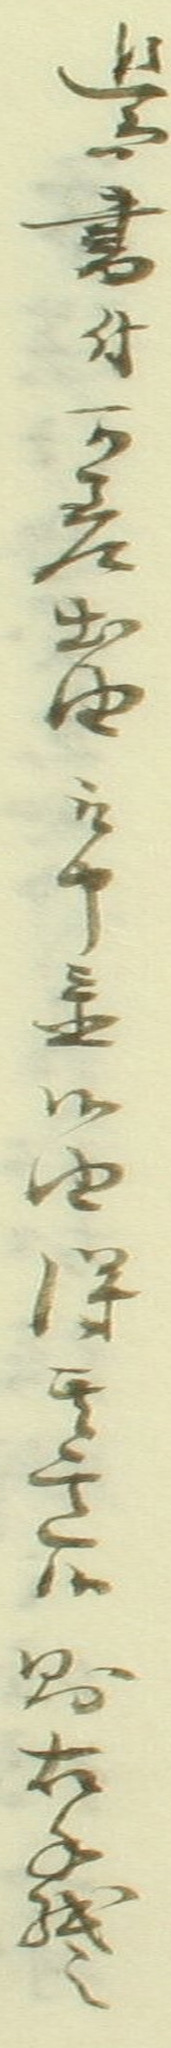追而書付可差出由被申置候由得其意候則右手紙之
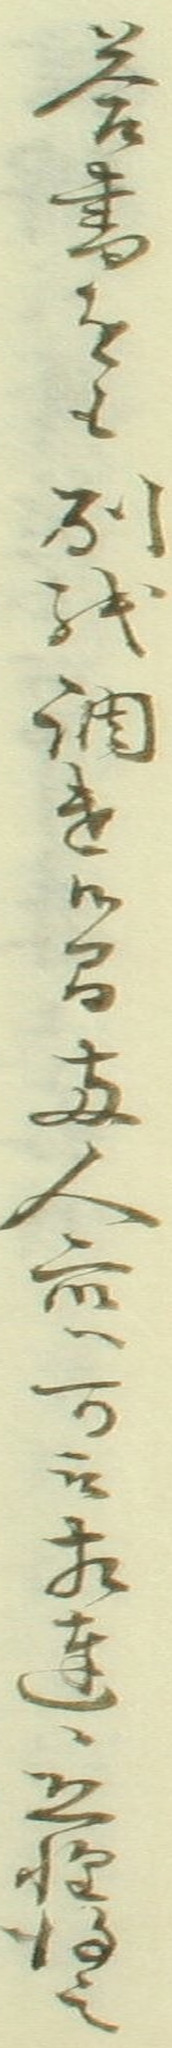答書をも別紙調遣候間両人衆へ可被相達候恐惶謹言
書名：異国船漂着記
